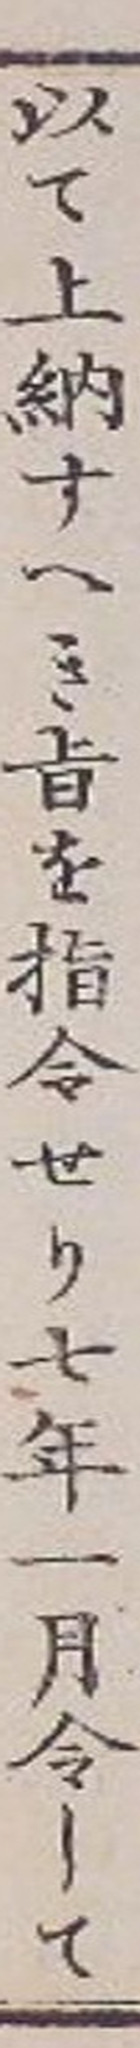以て上納すへき旨を指令せり七年一月令して
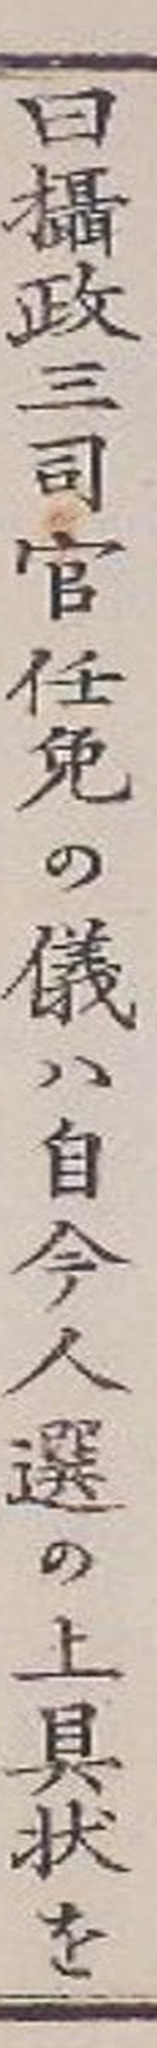曰摂政三司官任免の儀は自今人選の上具状を
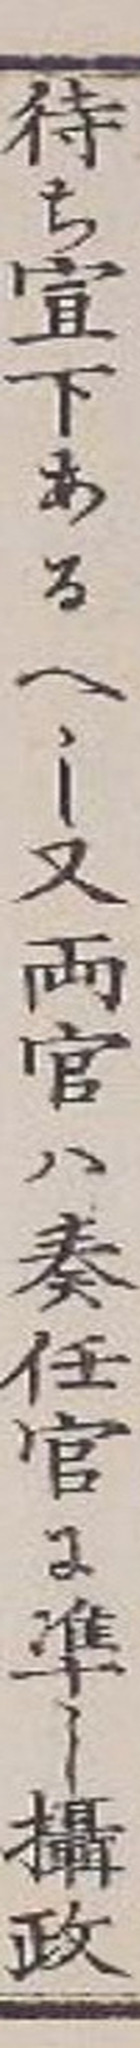待ち宣下あるへし又両官は奏任官に準し摂政
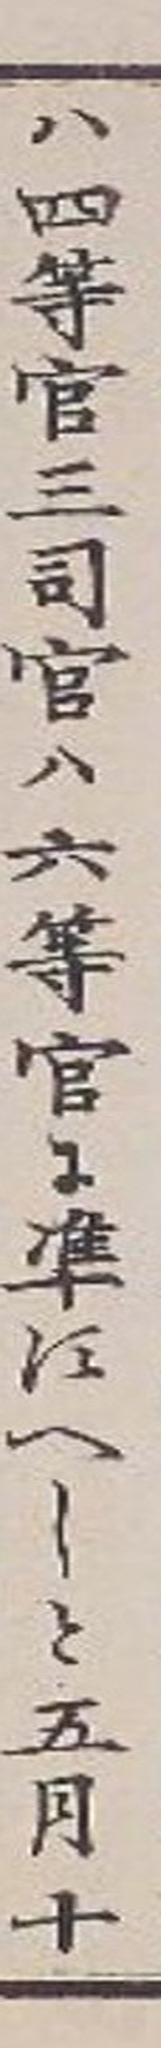は四等官三司官は六等官に準すへしと五月十
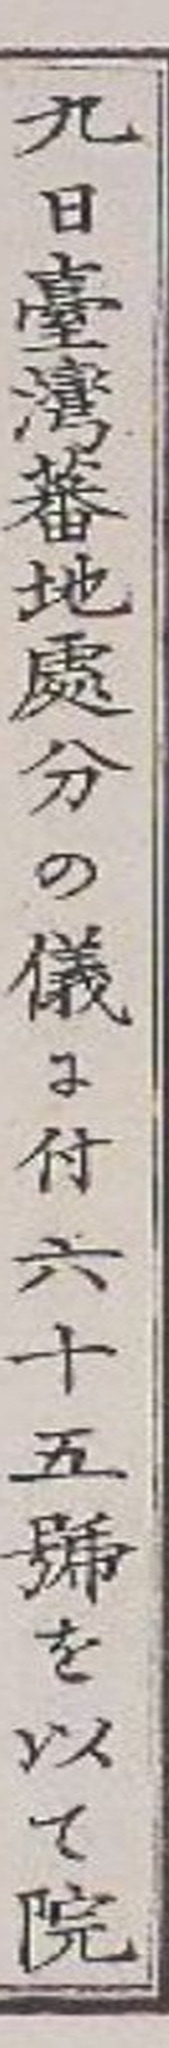九日台湾蕃地処分の儀に付六十五号を以て院
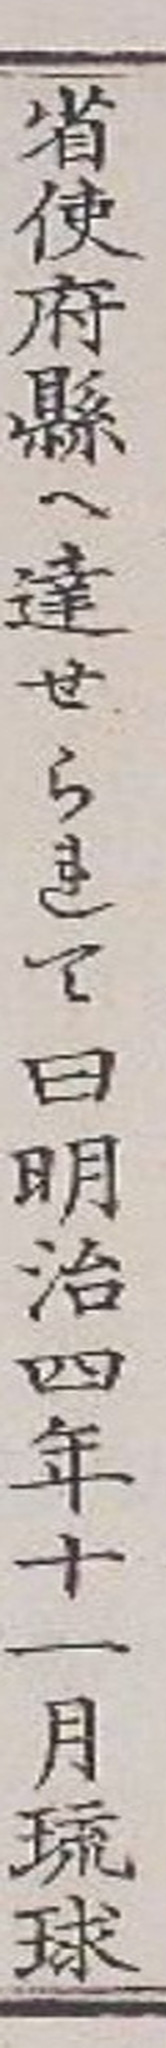省使府県へ達せられて曰明治四年十一月琉球
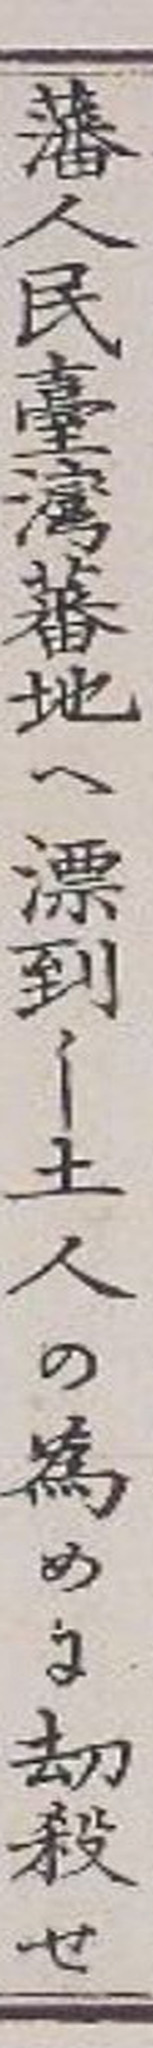藩人民台湾蕃地へ漂到し土人の為めに刧殺せ
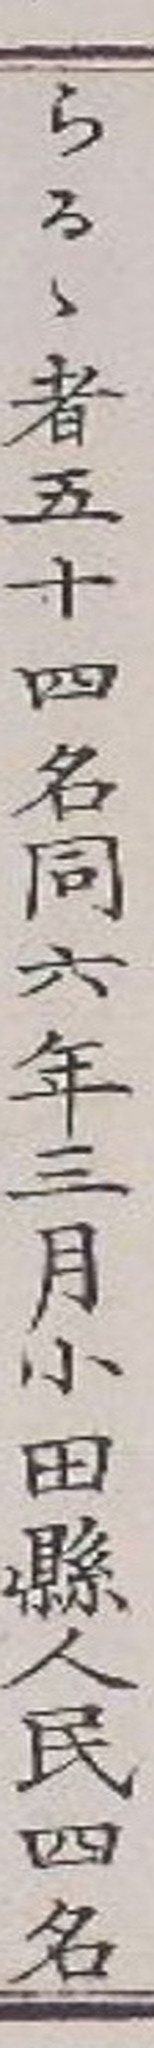らるゝ者五十四名同六年三月小田県人民四名
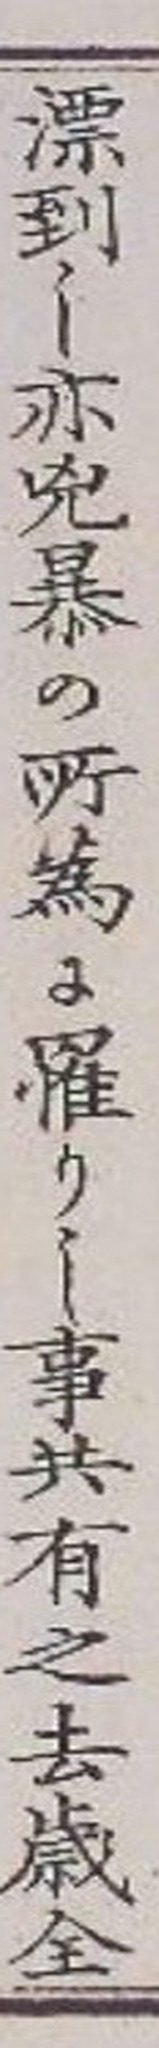漂到し又兇暴の所為に罹りし事共有之去歳全
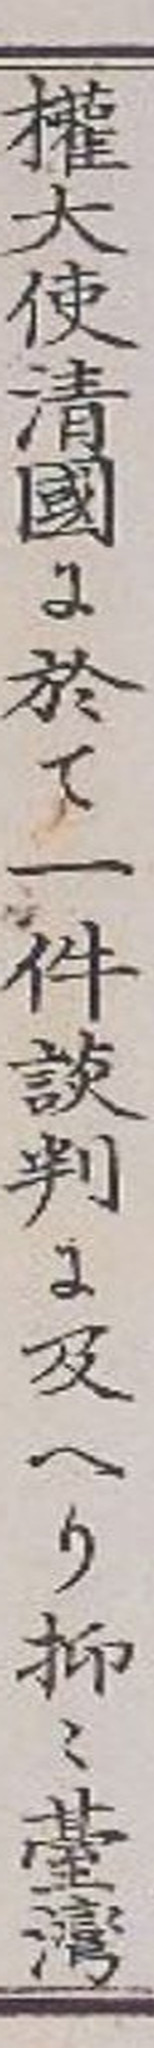権大使清国に於て一件談判に及へり抑々台湾
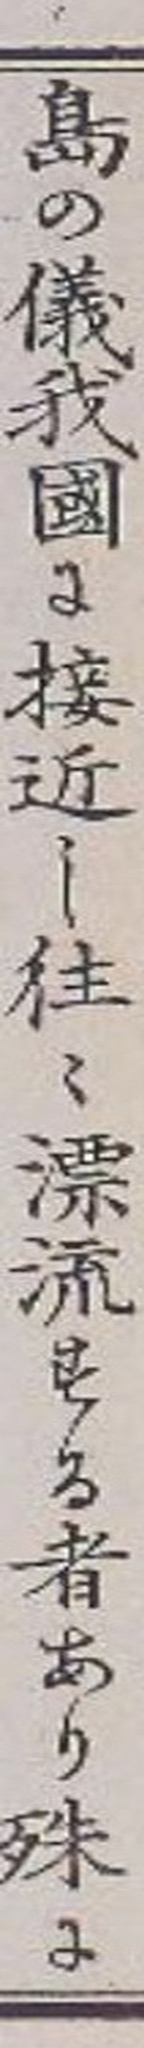島の儀我国に接近し往々漂流する者あり殊に
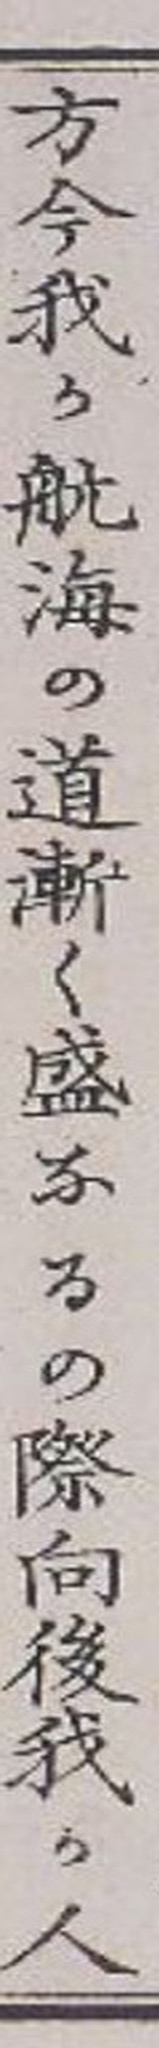方今我か航海の道漸く盛なるの際向後我か人
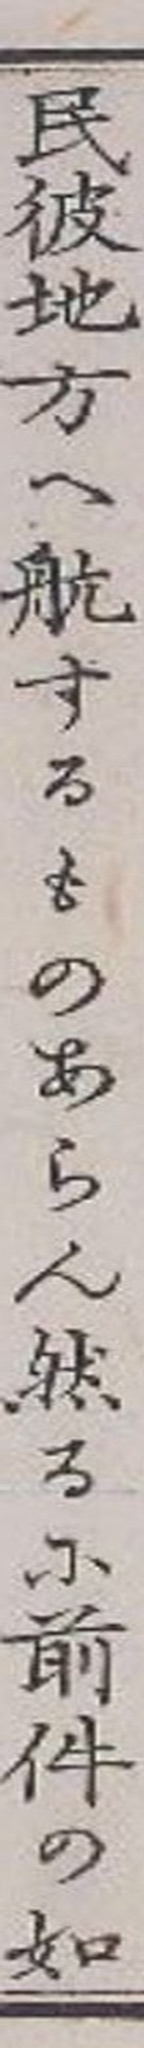民彼地方へ航するものあらん然るに前件の如
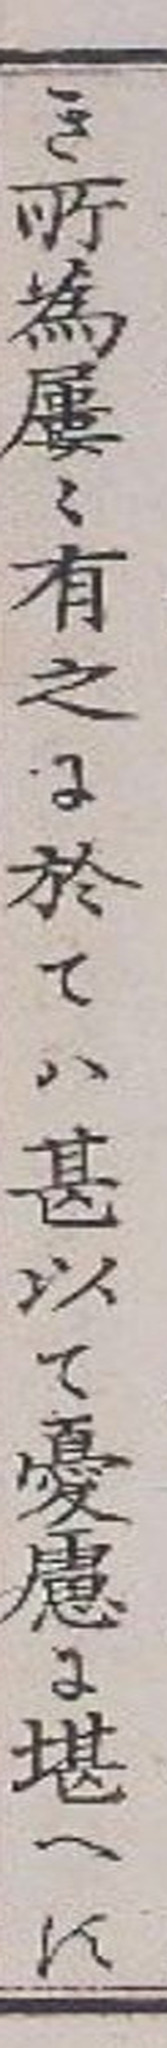き所為屡々有之に於ては甚以て憂慮に堪へす

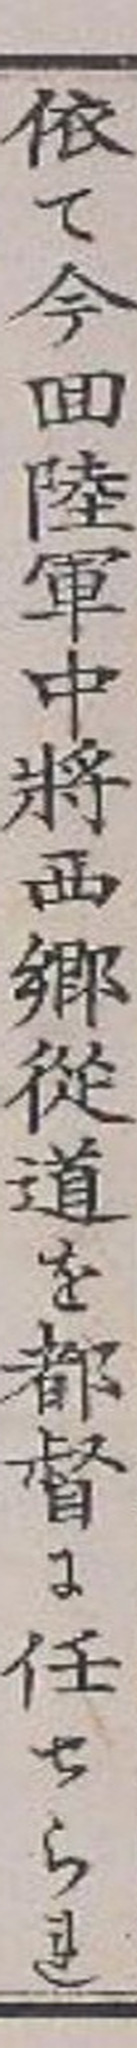依て今回陸軍中将西郷従道を都督に任せられ
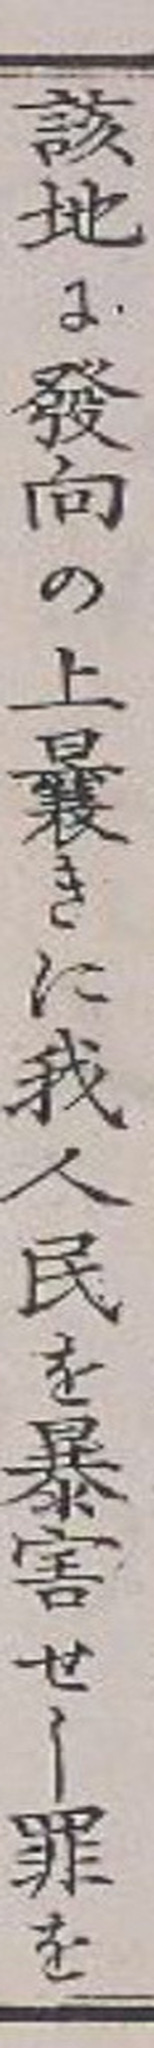該地に発向の上曩きに我人民を暴害せし罪を
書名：南島紀事 下
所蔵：University of the Ryukyus Library
